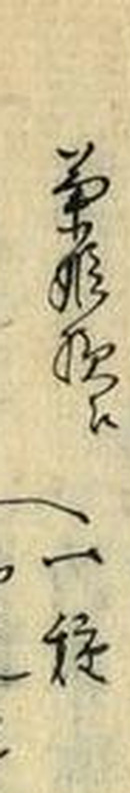菊姫様江一種
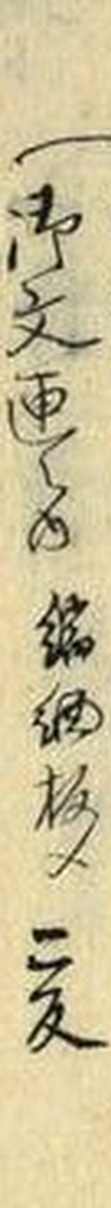御文匣之内縮緬板〆二反
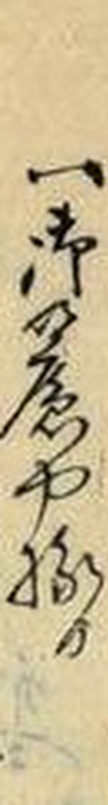一御簾中様ゟ
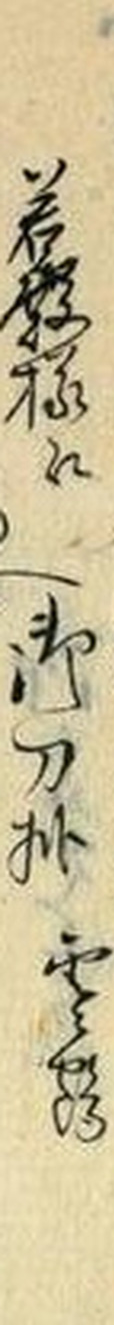若殿様江御刀掛雪ニ鶴
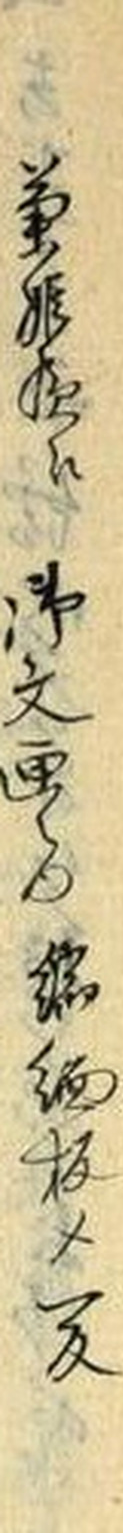菊姫様江御文匣之内縮緬板〆一反
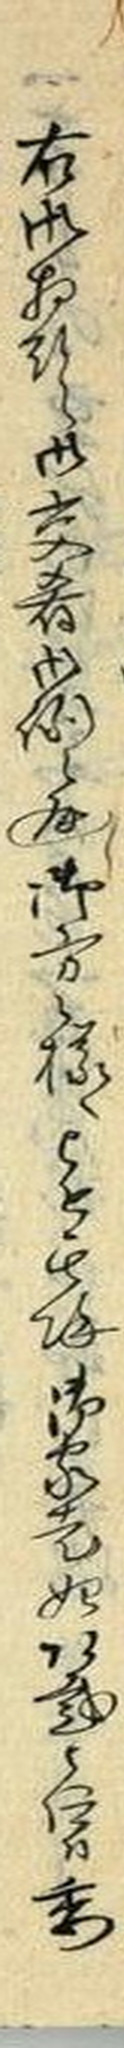右御拝領之御交肴御例之通御方々様へ被進其餘御家老始頂戴被仰付委
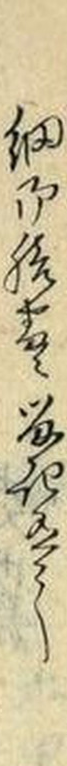細御膳番ニ留記有之
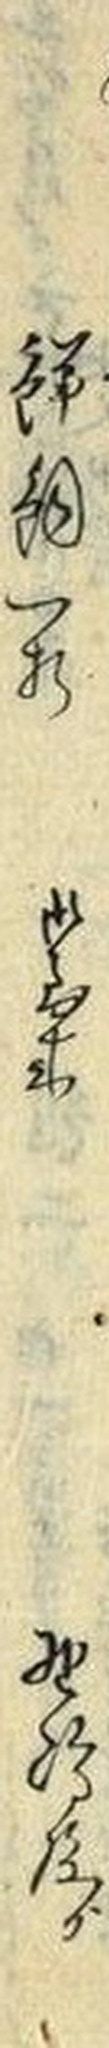鮮鯛一折御到来野嶋殿ゟ
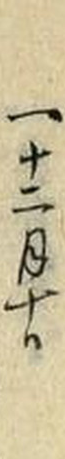一十二月十日
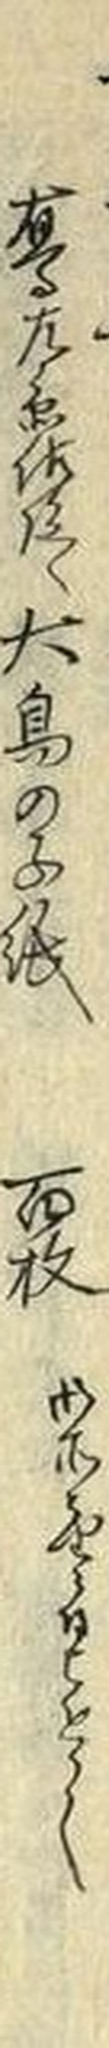有馬左兵衛佐殿へ大鳥の子紙百枚御所望ニ付被進之
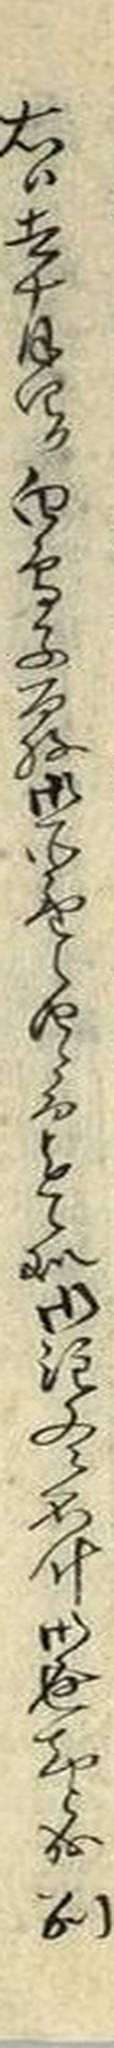右ハ去十月四日白鳥子百枚御所望之由ニ而被進候処御注文ニ不叶御返却被成別
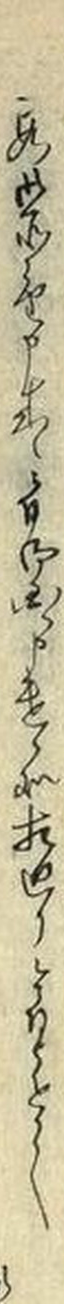段御所望申来候ニ付御国へ申遣候処相廻り候ニ付今日被進之
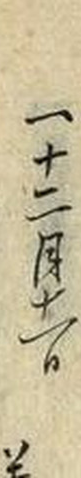一十二月十一日
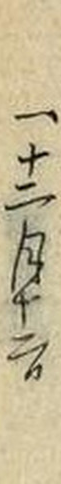一十二月十日
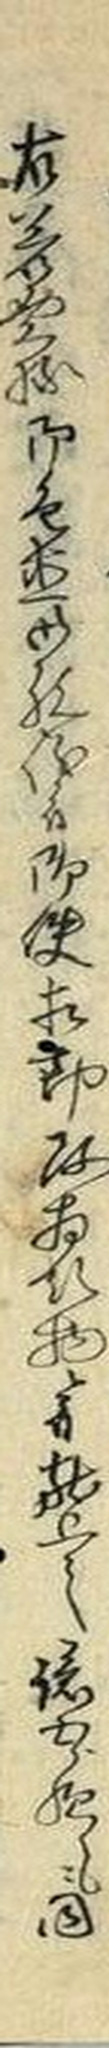右若殿様御色直御祝儀ニ付御使相勤致拝領物候ニ付献上之謙五郎様へも同
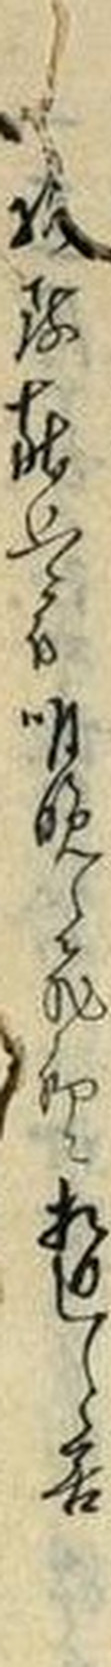様致献上候ニ付明晩之飛脚ニ相廻候筈
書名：少傅日録抄（斉承付側向頭取日記、在府）
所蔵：福井県文書館 Fukui Prefectural Archives
